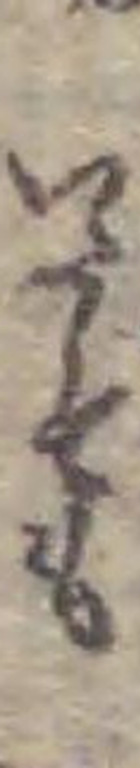いたしても
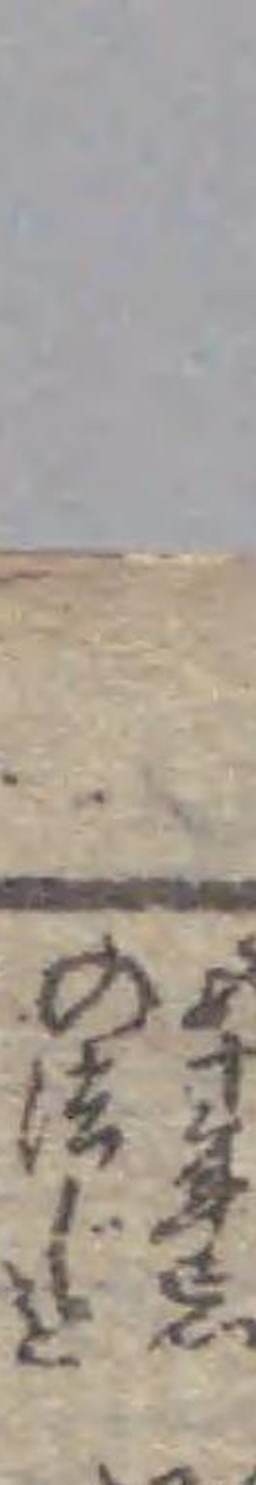の法じを
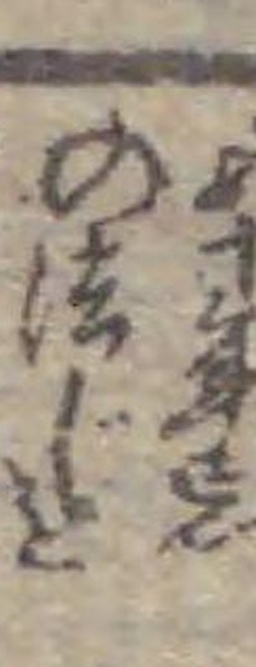の法じを
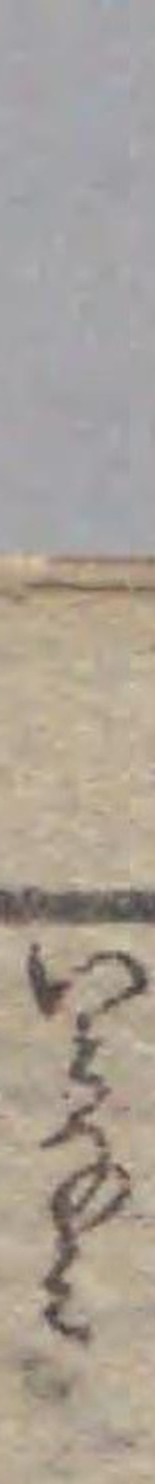いとなみ
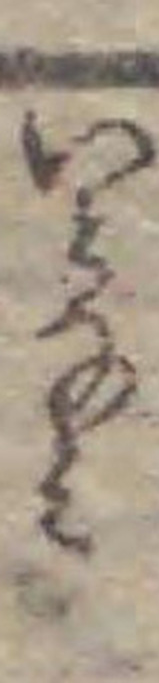いとなみ
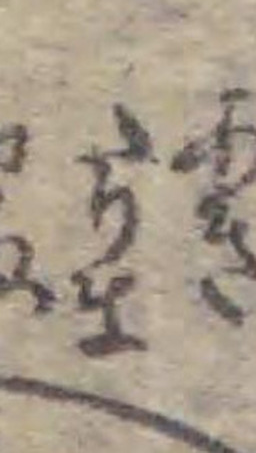たりま
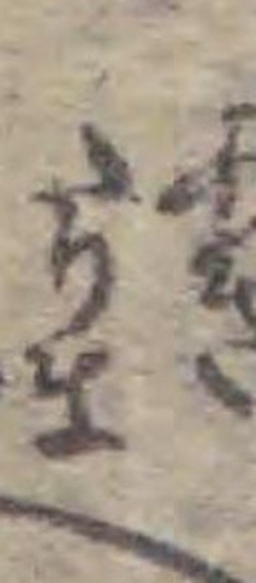たりま
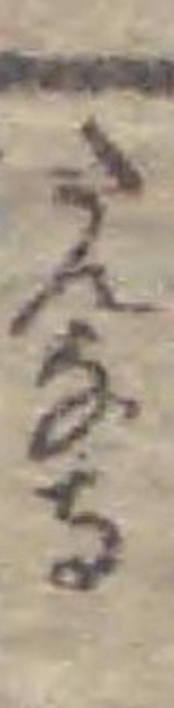たんな寺
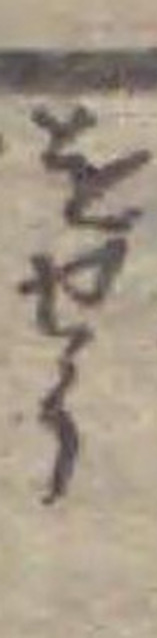をせう
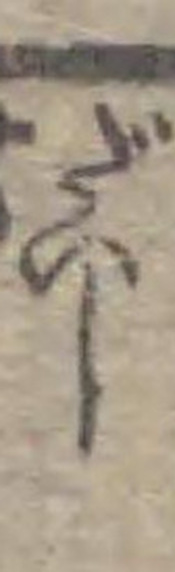だいし
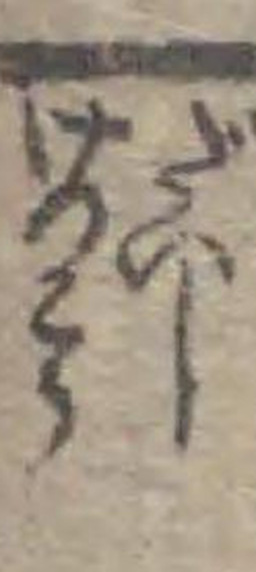けつこう
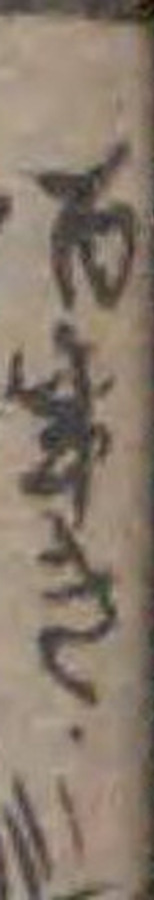百年き
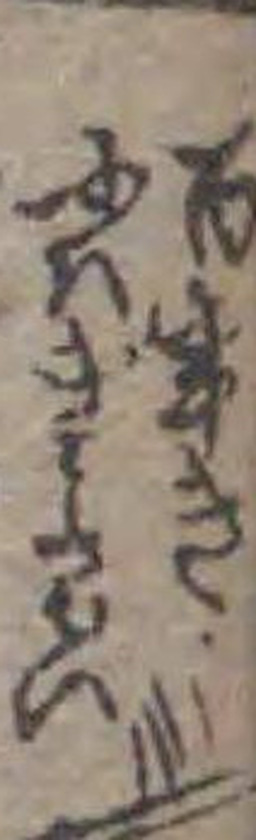にはきよるい
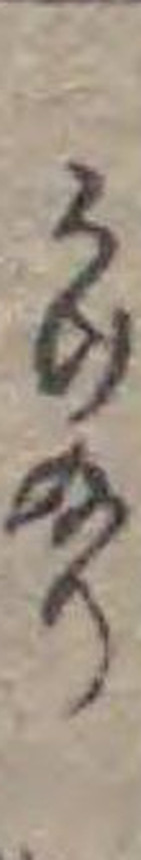うけ給り
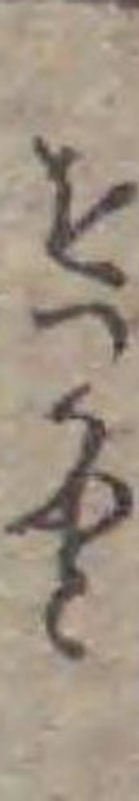をつかふと
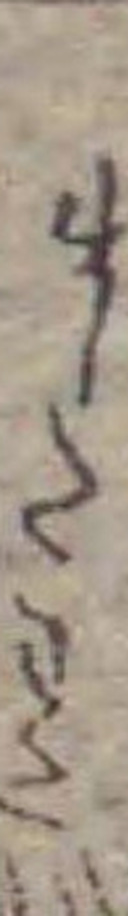ましたわた
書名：見徳一炊夢 : 3巻
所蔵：国立国会図書館 National Diet Library, JAPAN
